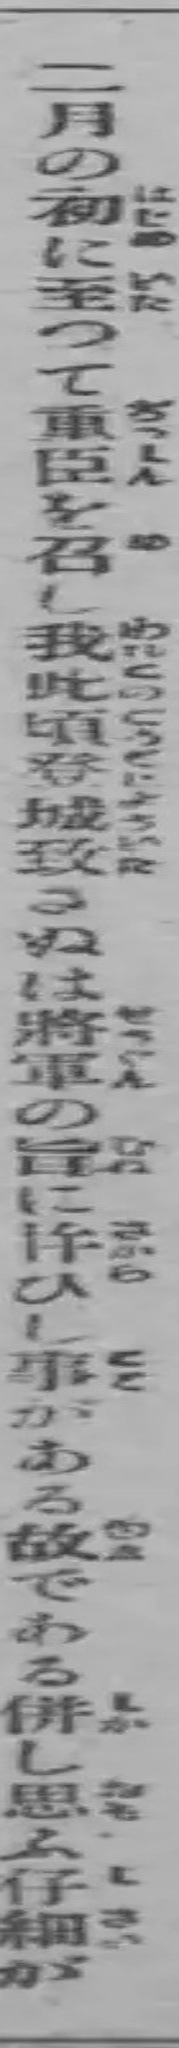二月の初に至つて重臣を召し我此頃登城致さぬは将軍の旨に忤ひし事がある故である併し思ふ仔細が
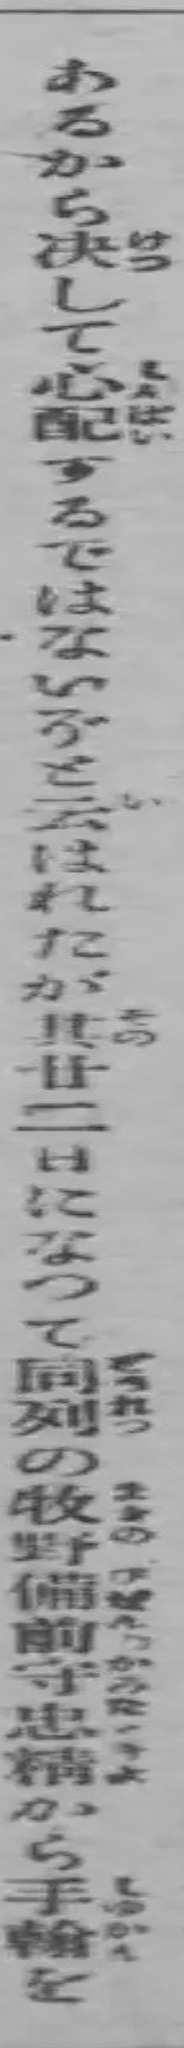あるから決して心配するではないぞと云はれたが其廿二日になつて同列の牧野備前守忠精から手翰を
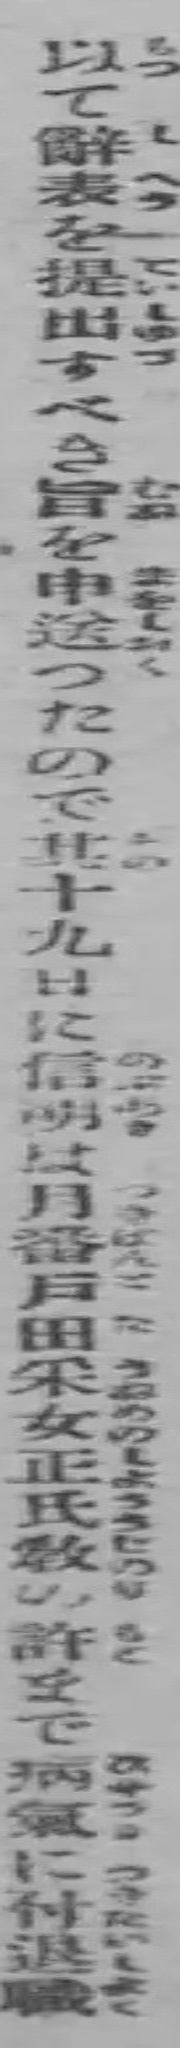以て辞表を提出すべき旨を申送つたので其十九日に信明は月番戸田采女正氏教の許まで病気に付退職
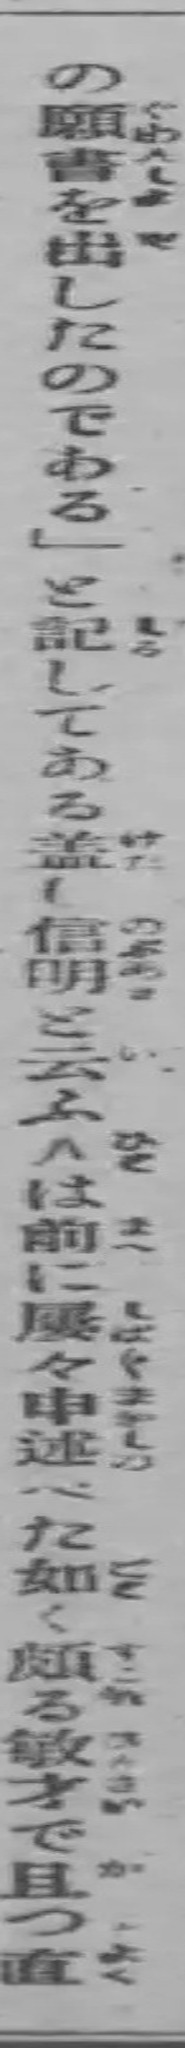の願書を出したのである」と記してある蓋し信明と云ふ人前に屡々申述べた如く頗る敏才でかつ且つ直
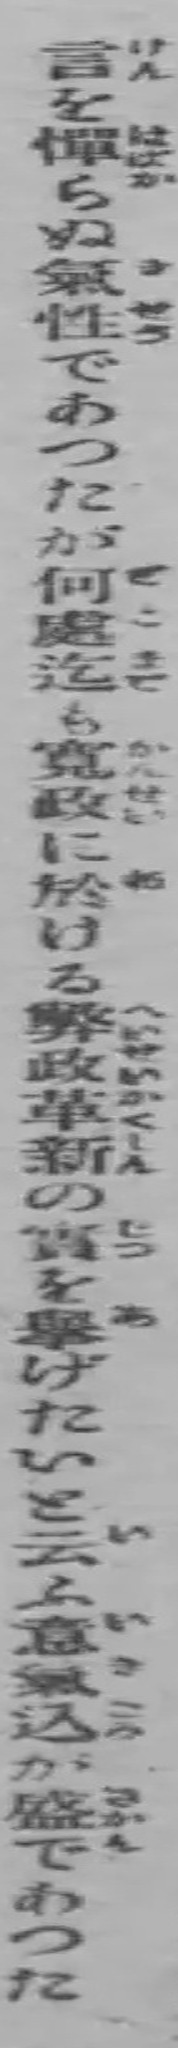言を憚らぬ気性であつたが何処迄も寛政に於ける弊政革新の実を挙げたいと云ふ意気込が盛であつた
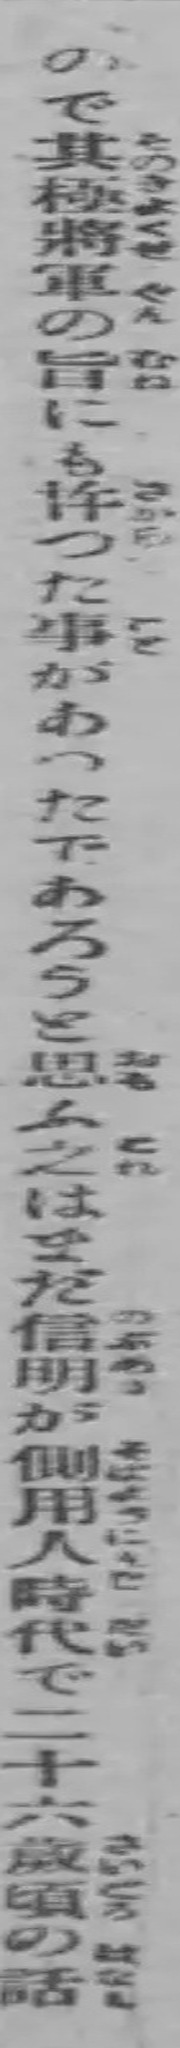信明の極諫ので其極将軍の旨にも忤つた事があつたであろうと思ふ之はまだ信明が側用人時代で二十六歳頃の話
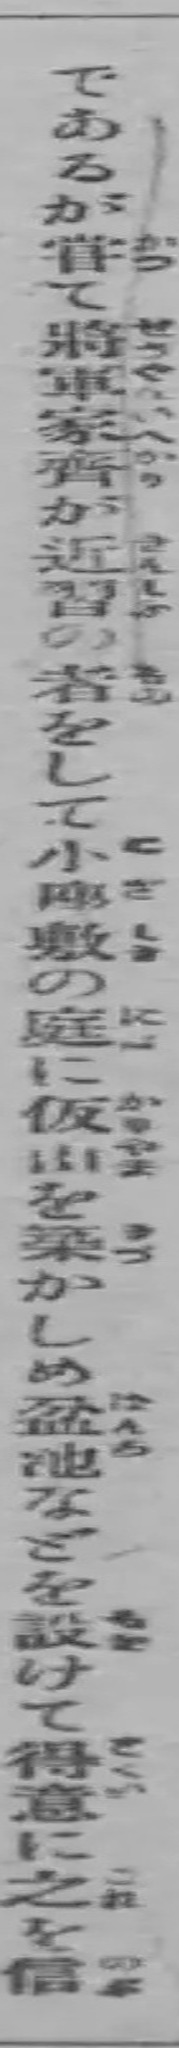であるが嘗て将軍の家斉が近習の者をして小座敷の庭に仮山を築かしめ盆池などを設けて得意に之を信
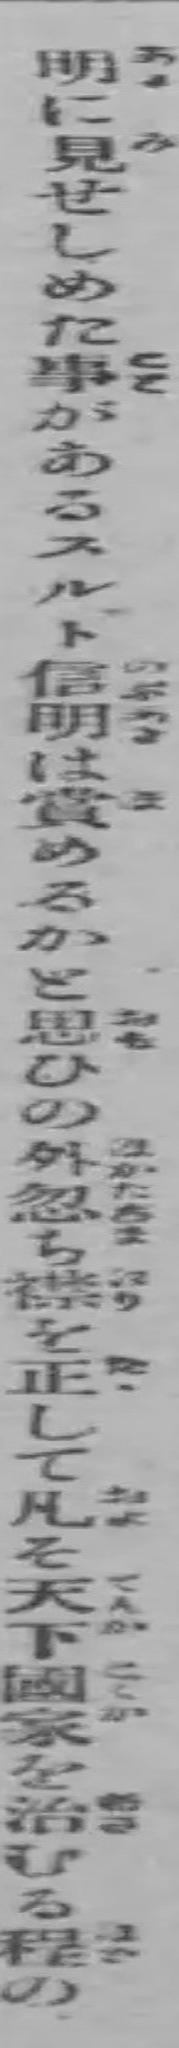明に見せしめた事があるスルト信明は賞めるかと思ひの外忽ち襟を正して凡そ天下国家を治むる程の
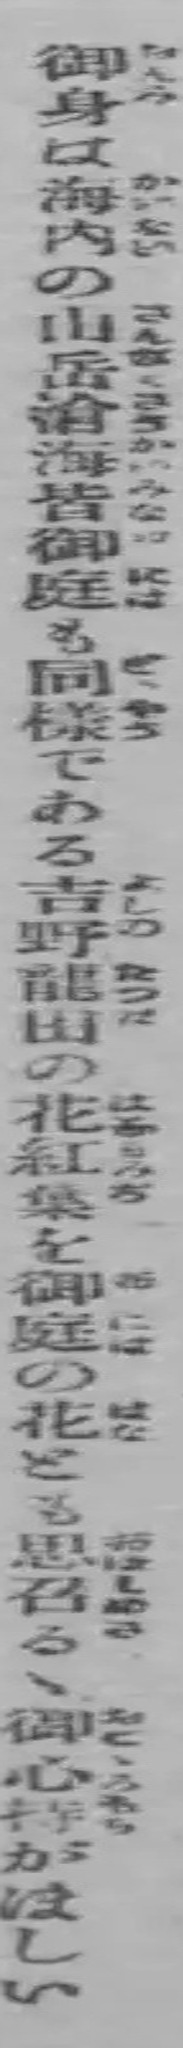御身は海内の山岳滄海皆御庭も同様である吉野龍田の花紅葉を御庭の花とも思召るゝ御心持がほしい
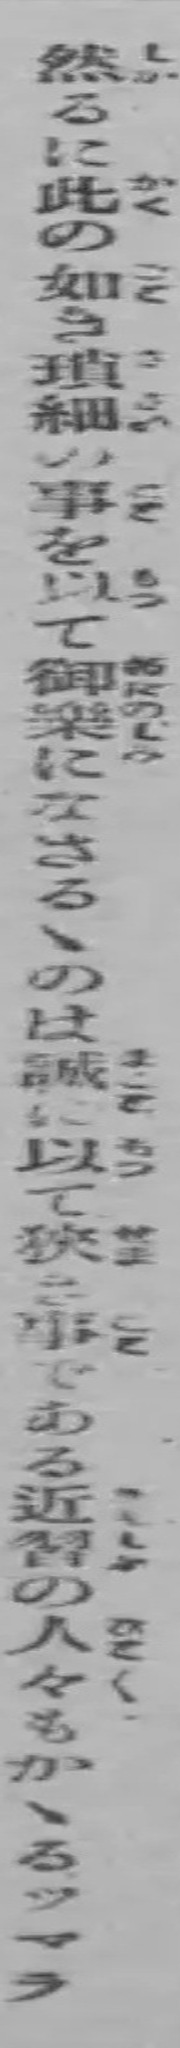然るに此の如き琑細の事を以て御楽になさるゝのは誠に以て狭き事である近習の人々もかゝるツマラ
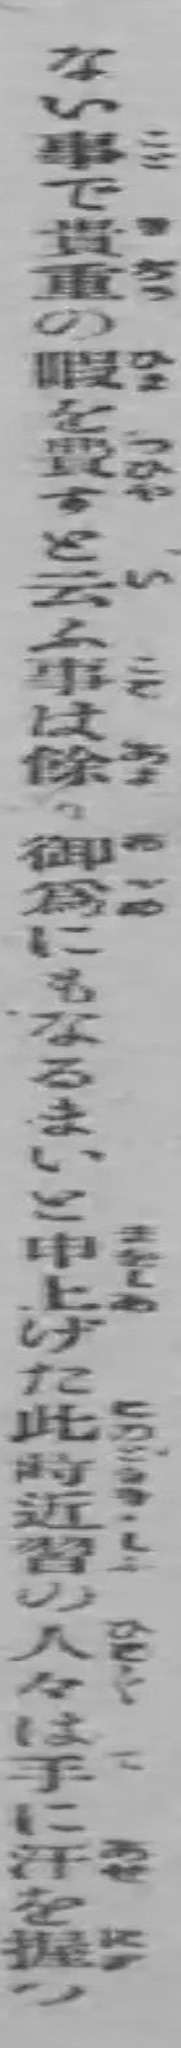ない事で貴重の暇を費すと云ふ事は余り御為にもなるまいと申上げた此時近習の人々は手に汗を握つ
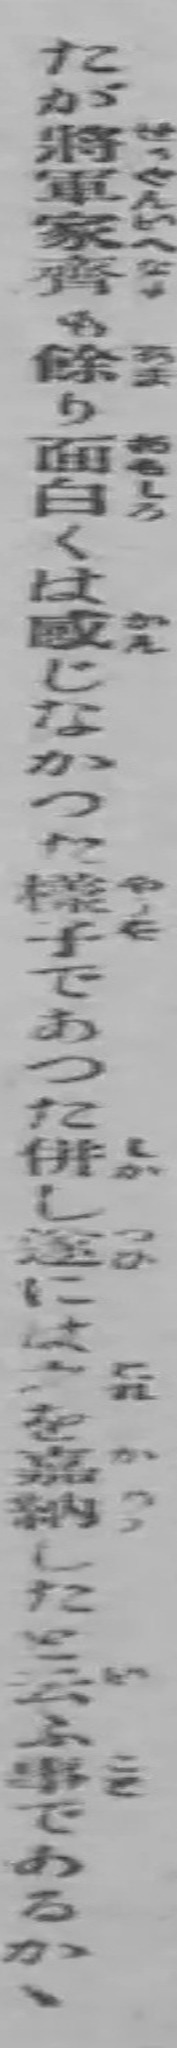たが将軍家斉も余り面白くは感じなかつた様子であつた併し遂には之を嘉納したと云ふ事であるかゝ
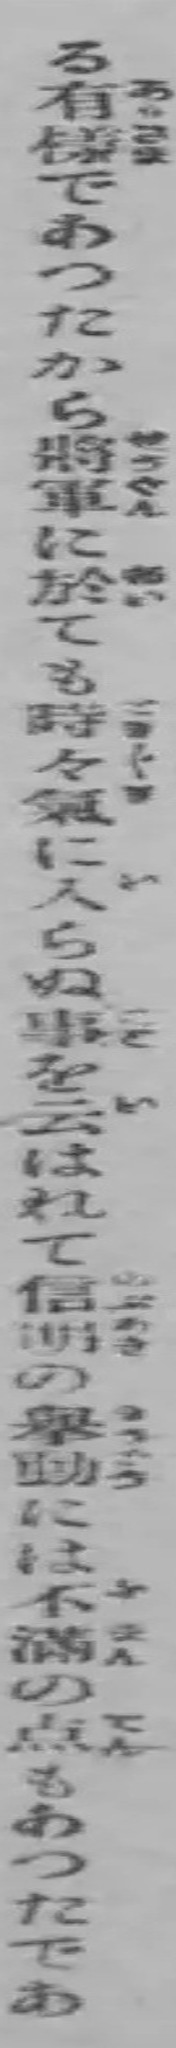る有様であつたから将軍に於ても時々気に入らぬ事を云はれて信明の挙動には不満の点もあつたであ
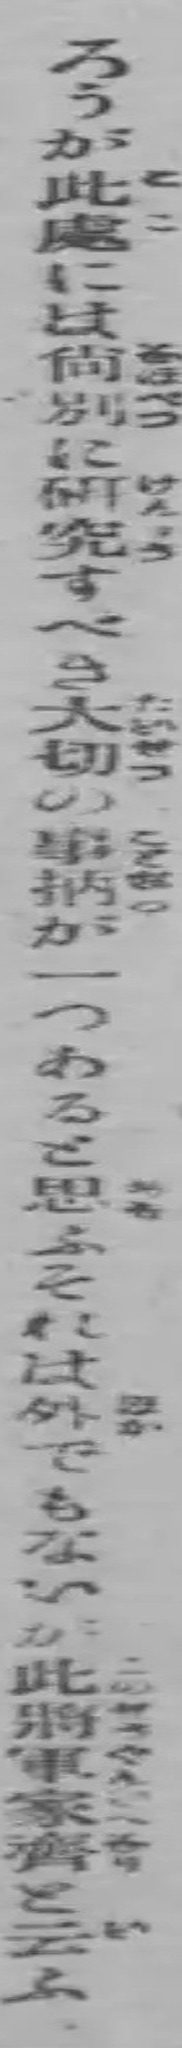ろうが此処には尚別に研究すべき大切の事柄が一つあると思ふそれは外でもないが此将軍家斉と云ふ
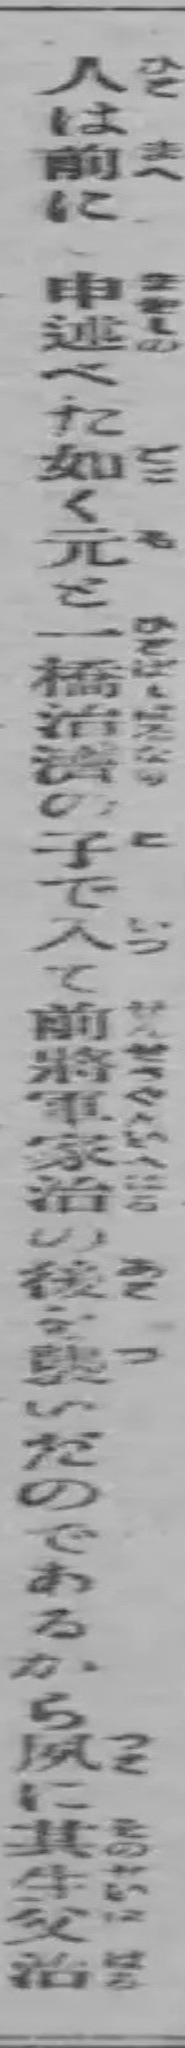大御所問題人は前にも申述べた如く元と一橋治済の子で入て前将軍家治の後を襲いだのであるから夙に其生父治
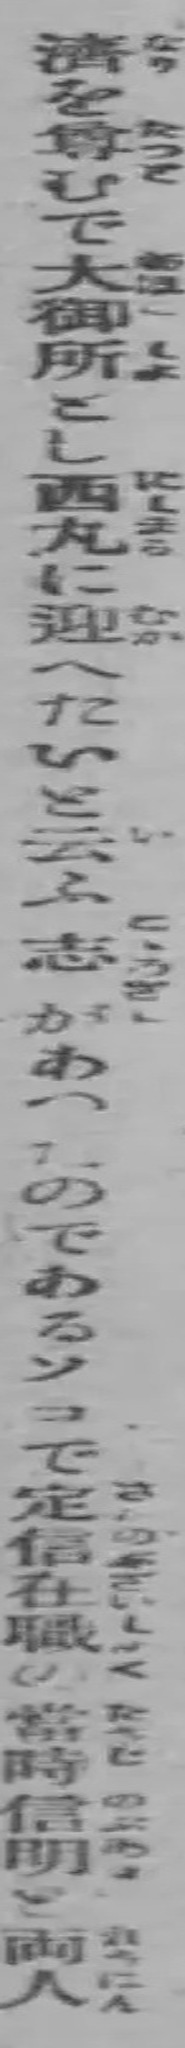済を尊むで大御所とし西丸に迎へたいと云ふ志があつたのであるソコで定信在職の当時信明と両人
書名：豊橋市史談
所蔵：国立国会図書館 National Diet Library, JAPAN
